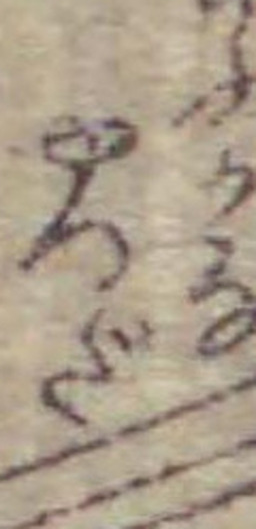やつだ

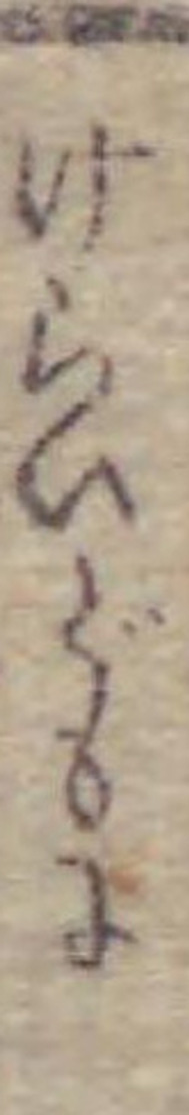けらいどもに
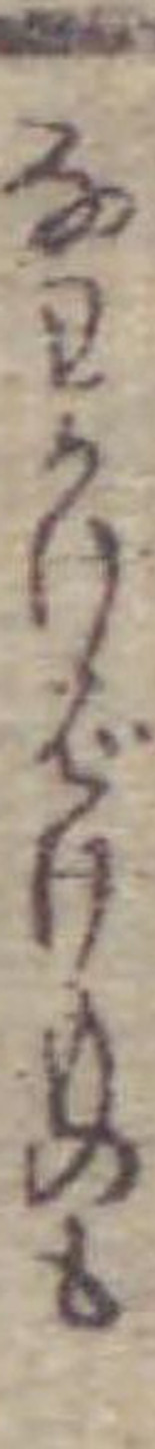なわかけばけものも
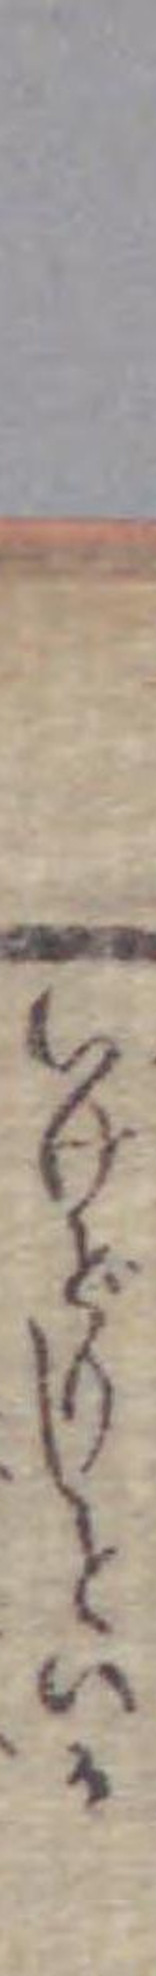いけどりしといか
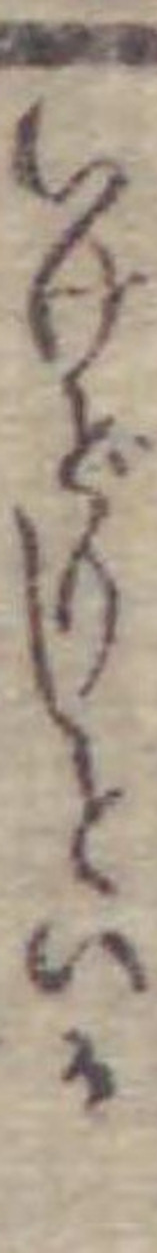いけどりしといか
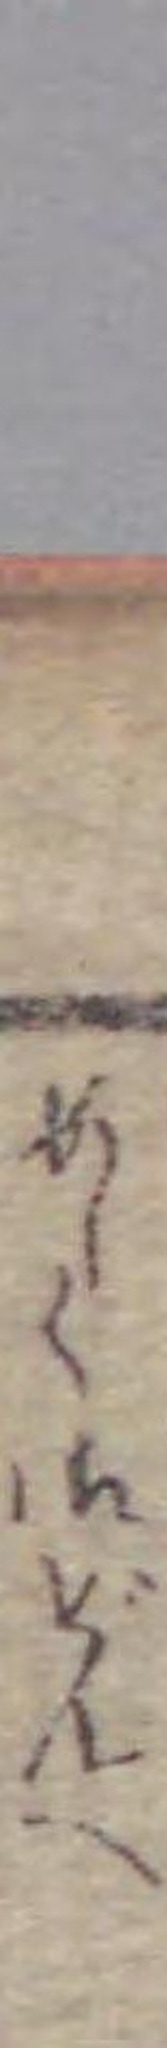めしく御ぜんへ
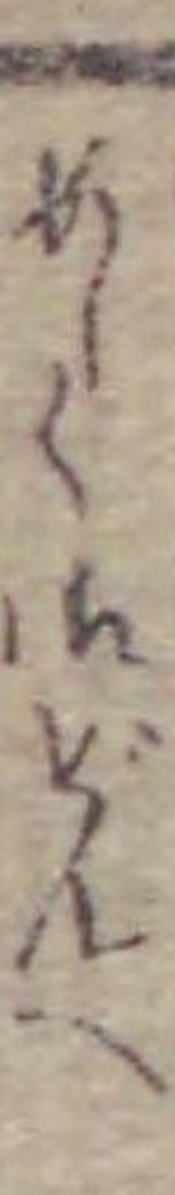めしく御ぜんへ
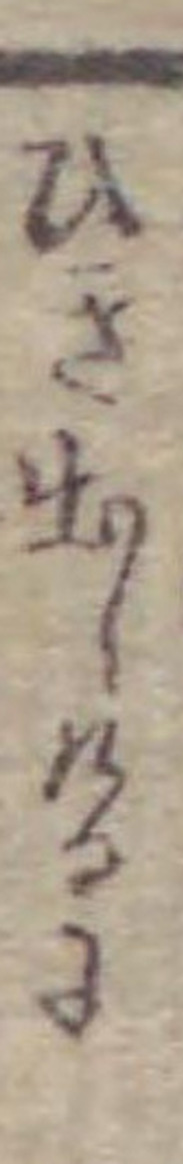ひき出しけるに
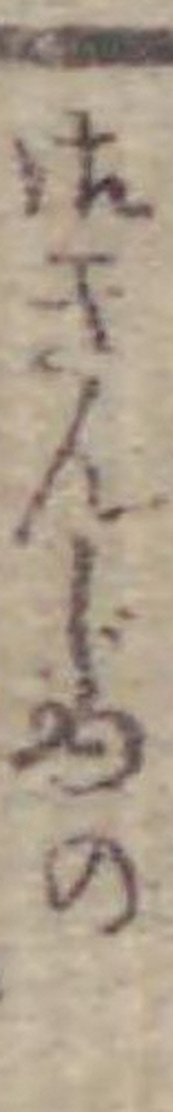御きんじゆの
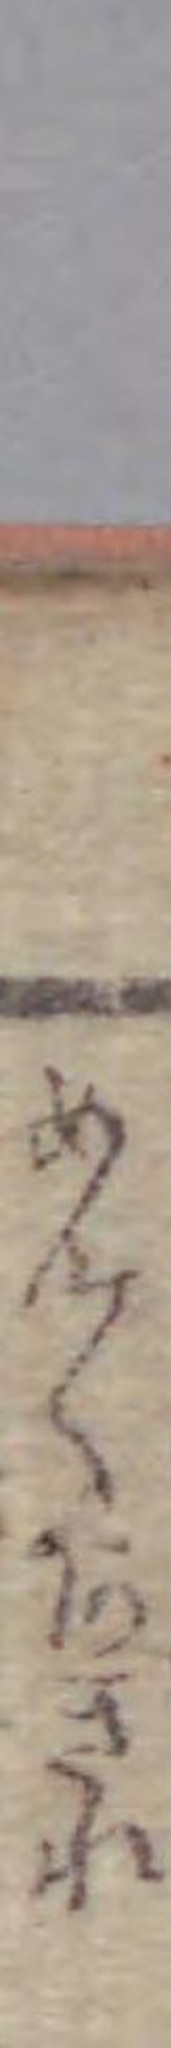めん〳〵あきれ
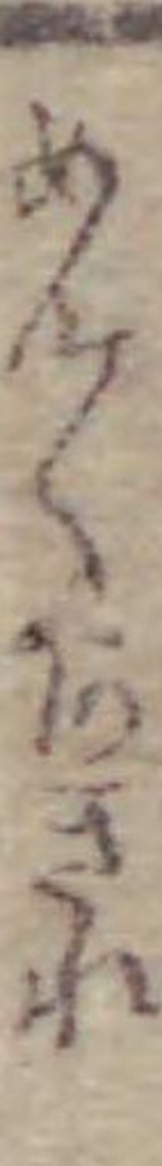めん〳〵あきれ
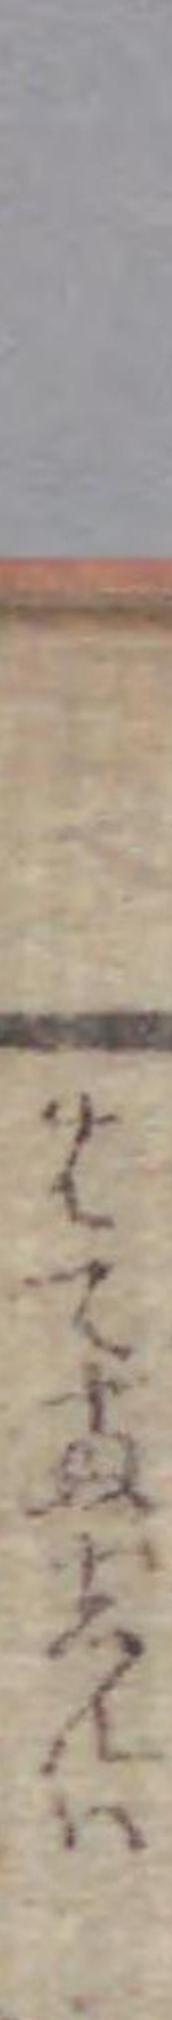はて両しんは
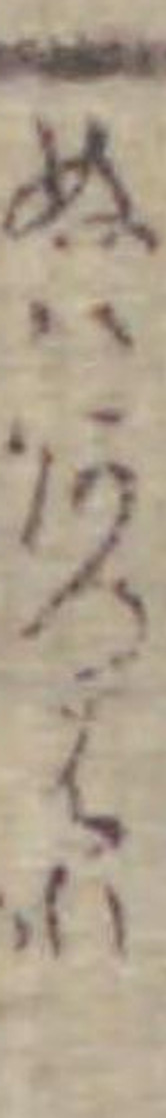ぬはあつはれ
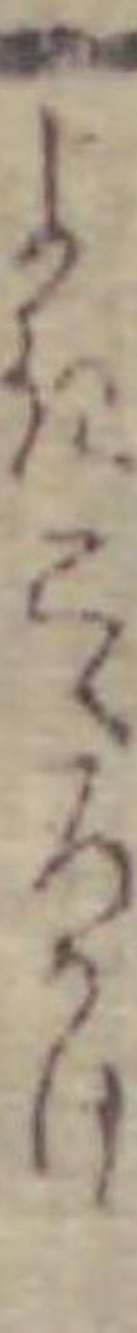よきこゝろがけ
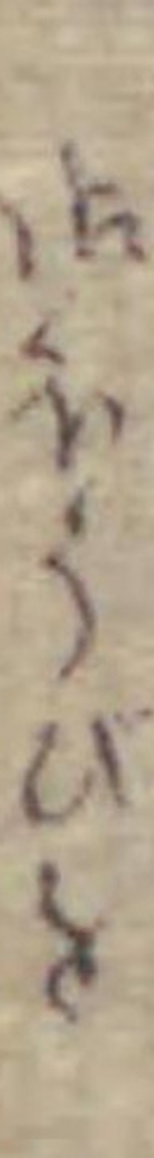御ほうびを
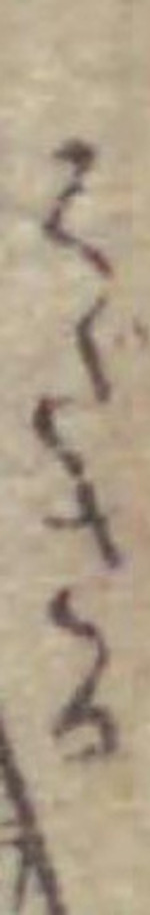くださる
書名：二日替 : 2巻
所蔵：国立国会図書館 National Diet Library, JAPAN
